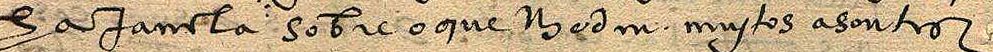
ha Janela sobre o que lhe deu mujtos asoutes
